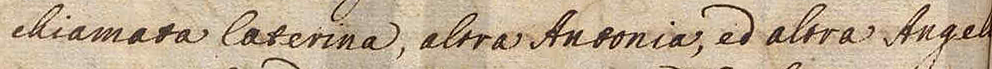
chiamata Caterina, altra Antonia, ed altra Angel_
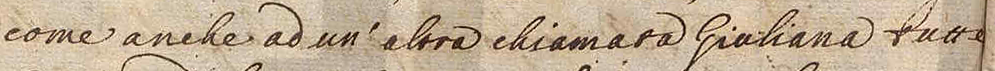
come anche ad un'altra chiamata Giuliana tutte
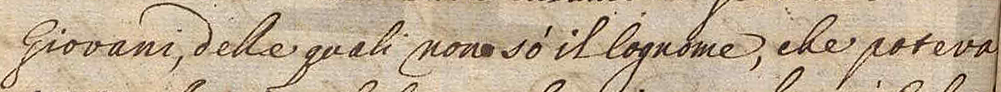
Giovani, delle quali non só il Cognome, che poteva
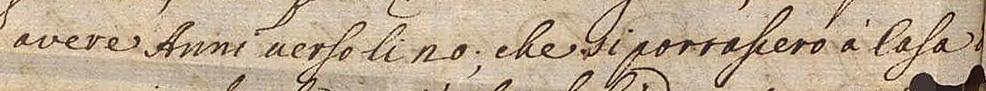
avere Anni uerso li no; che si portassero á Casa _
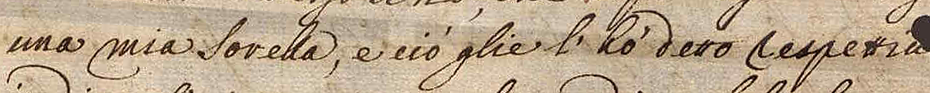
una mia Sorella, e ció glie l'hó detto respettiu_
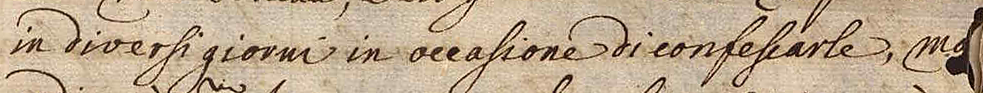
in diversi giorni in occasione di confessarle, m_
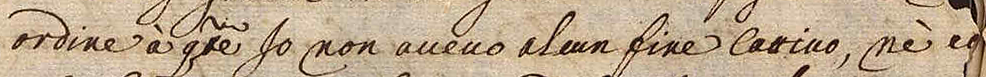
ordine à qtē Jo non aueuo alcun fine Cattiuo, nē c_
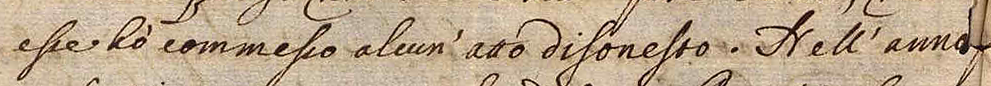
esse hó commesso alcun'atto disonesto. Nell'anno _
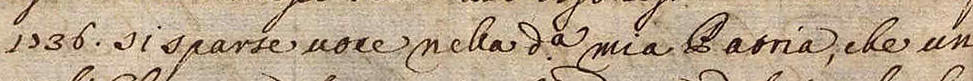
1736. si sparse uoce nella d.a mia Patria, che un
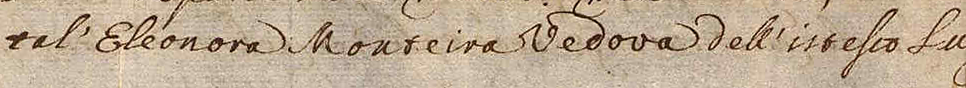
tal'Eleonora Monteira Vedova dell'istesso Lu
